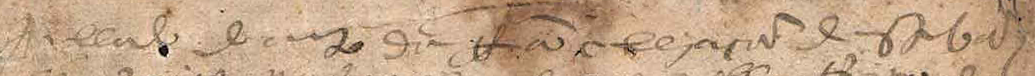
trellado do auto da Rec̄ocilljaçaõ destevaõ
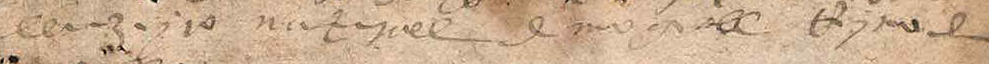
lluzejro naturall de moguell Rejno de
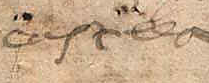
castella
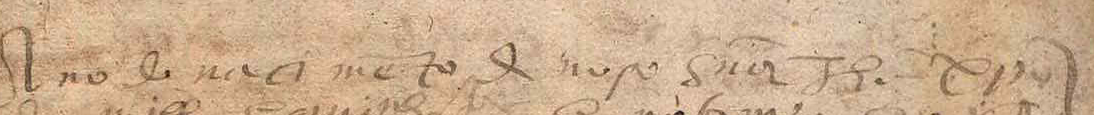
Ano do nacimēto de noso Snōr Jhū xpō
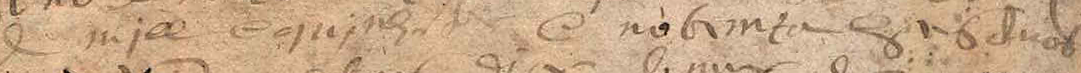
de mjll e qujnhētos e novemta e seis Anos
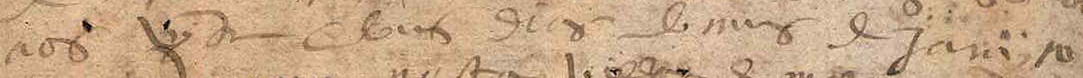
aos vj̄te e dous dias do mes de Janejro
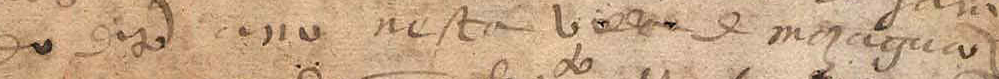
do dito ano nesta villa de mazaguão
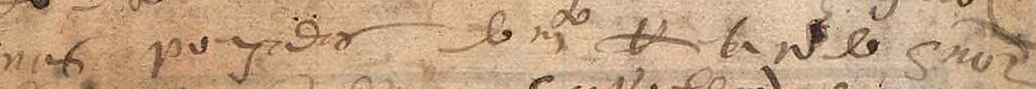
nas pousadas do mto Reverēdo Snōr
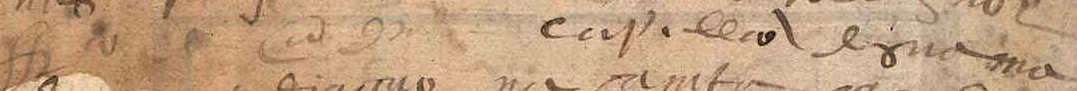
ffrco de ādrade capellaõ de sua ma
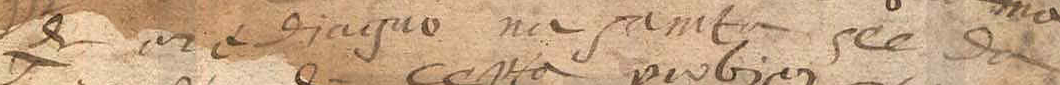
gde arcediaguo na samta see da
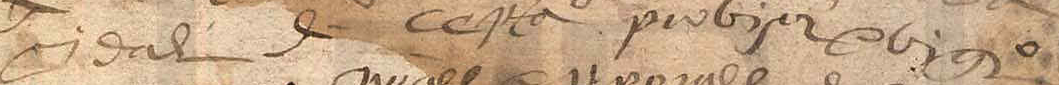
cidade de cepta provisor e vigro
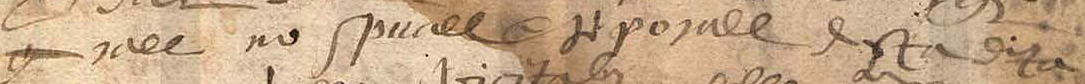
gerall no spuāll e tēporall desta dita
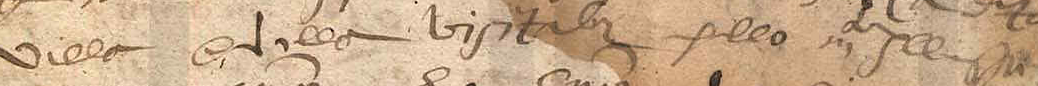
villa e ē ella visitador p̄llo mto Jllustre
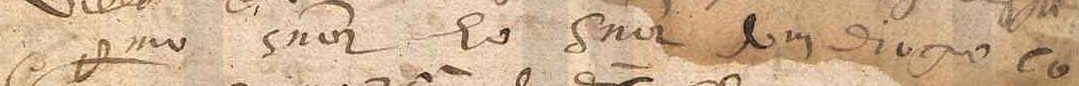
e Rmo snōr ho Snōr dom diogo co
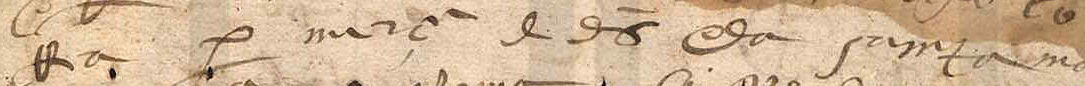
Rea ꝑ merce de ds̄ e da samta ma
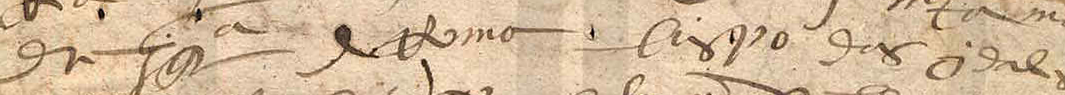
dre Jgra de Roma bispo das cidades
